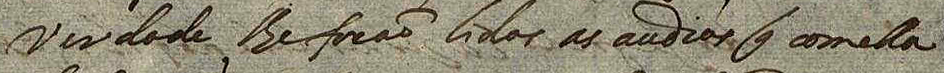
verdade lhe foraõ lidas as audiās q̄ com ella
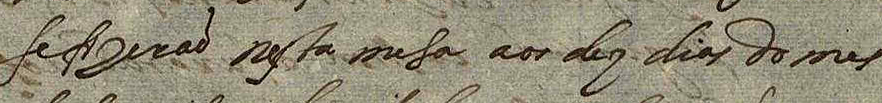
se fizeraõ nesta mesa aos dez dias do mes
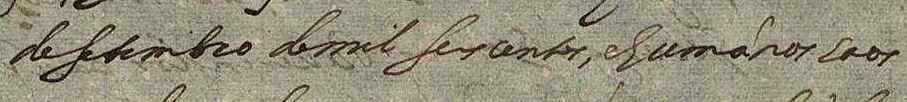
de setembro de mil seiscentos, e hum an̄os E aos
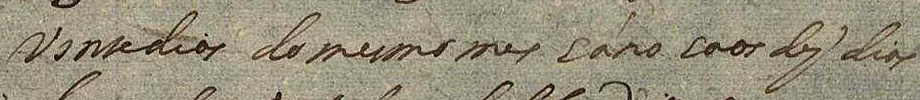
vinte dias do mesmo mes E ano E aos dez dias
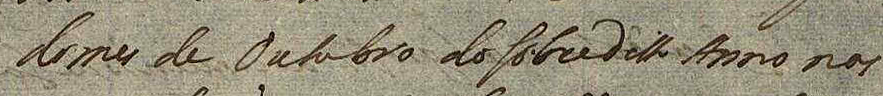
do mes de Outubro do sobreditto Anno nas
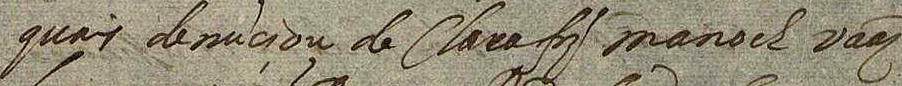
quais denūciou de Clara frz̄ manoel vaāz
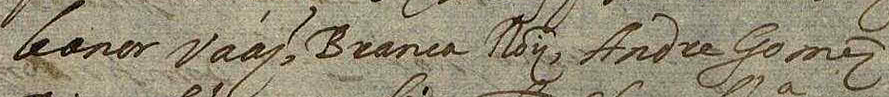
leanor vaaz̄, Branca Roīz, Andre Gomēz
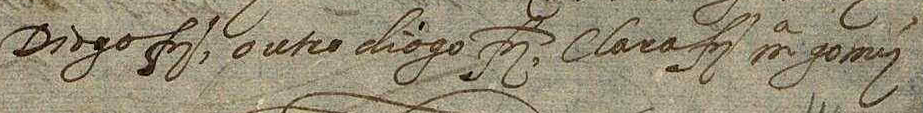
Diogo frz̄, outro diogo f̄rz, Clara frz̄ ma gomez̄
